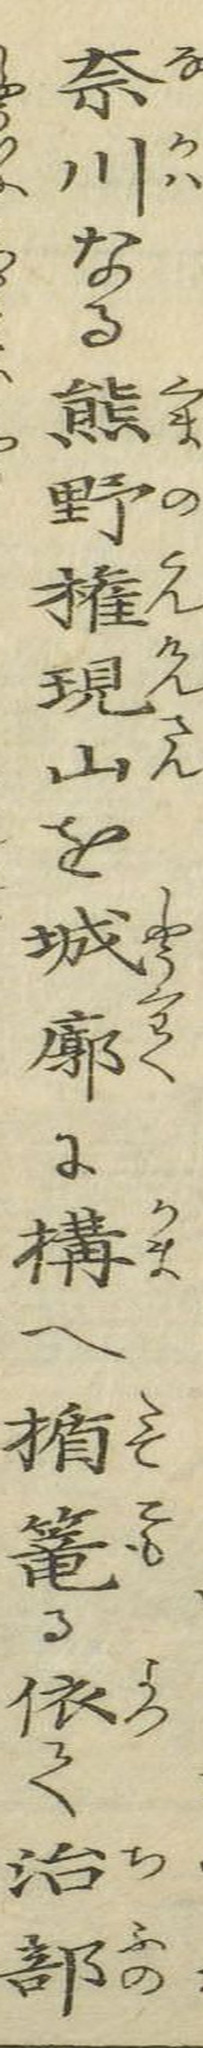奈川なる熊野権現山を城廓に構へ楯篭る依て治部
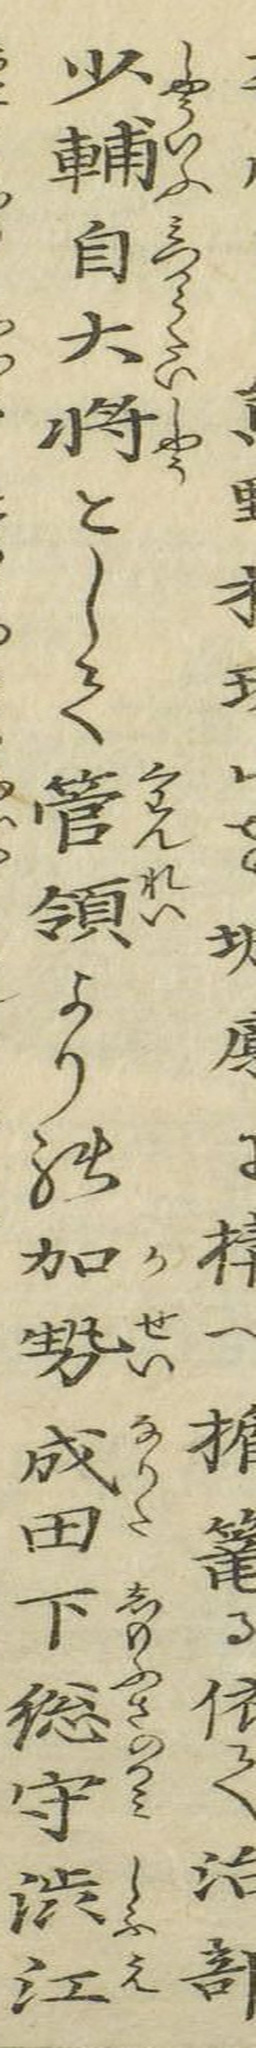少輔自大将として管領より結加勢成田下総守渋江
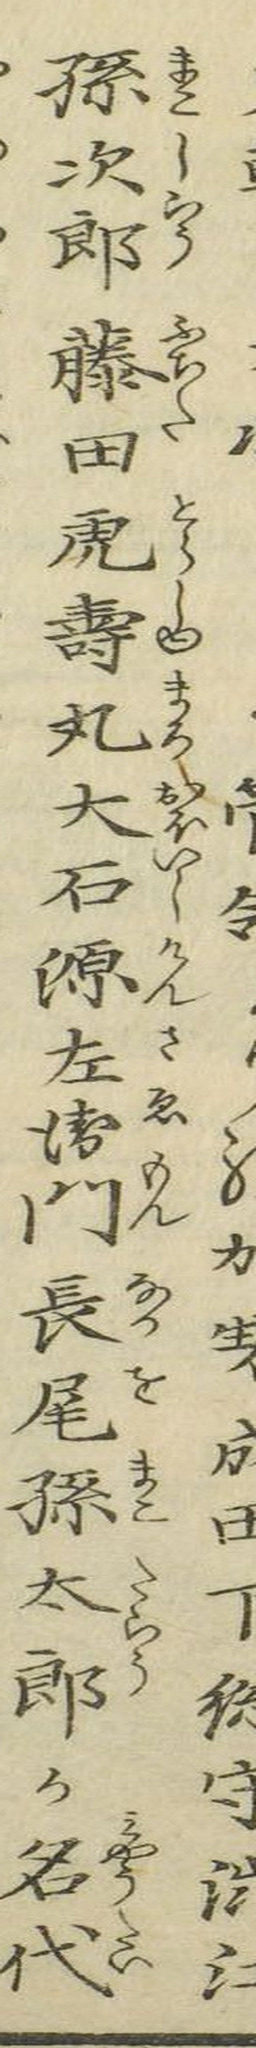孫次郎藤田虎壽丸大石源左衛門長尾孫太郎か名代
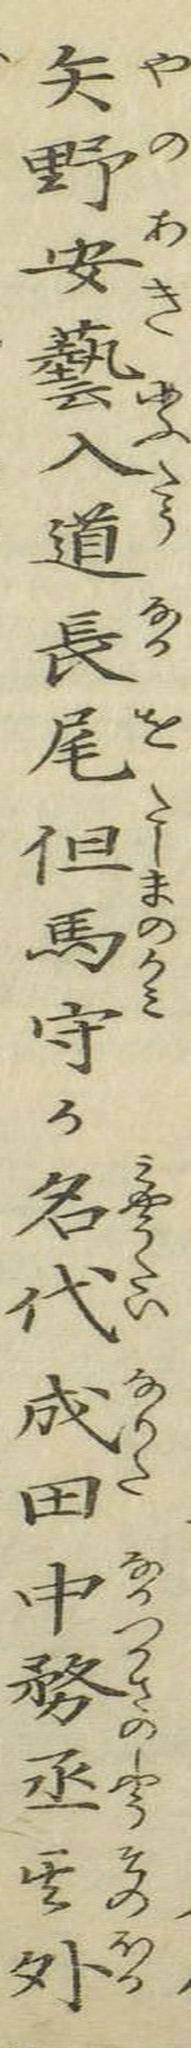矢野安藝入道長尾但馬守か名代成田中務丞其外
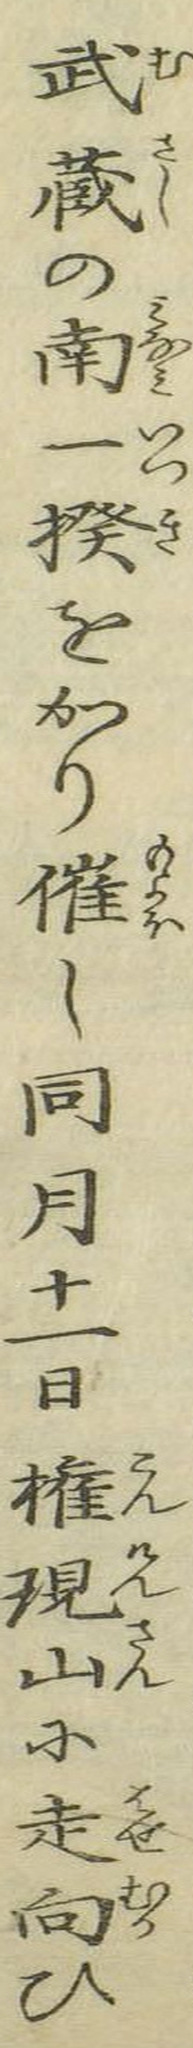武蔵の南一揆をかり催し同月十一日権現山に走向ひ
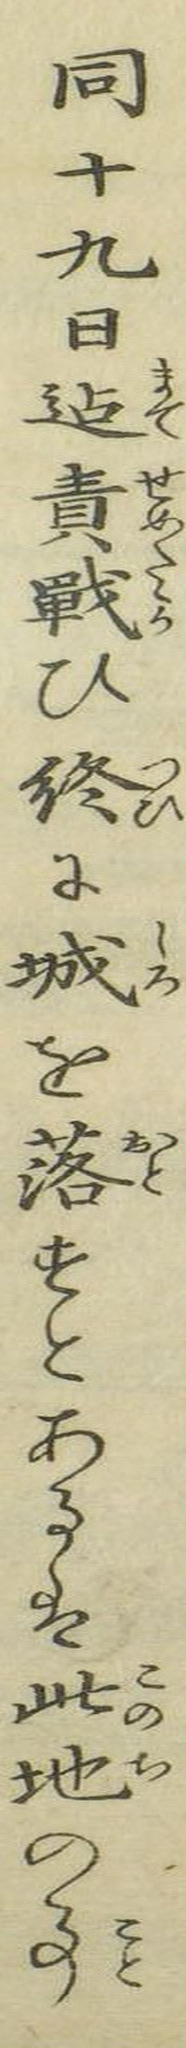同十九日迄責戦ひ終に城を落すとあるは此地の事

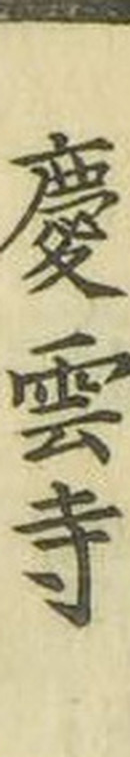慶雲寺

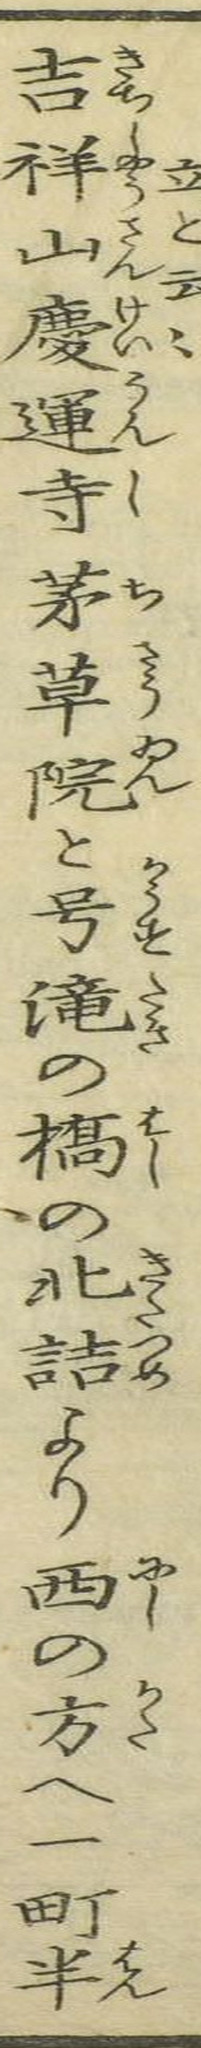吉祥山慶運寺茅草院と号滝の橋の北詰より西の方へ一町半
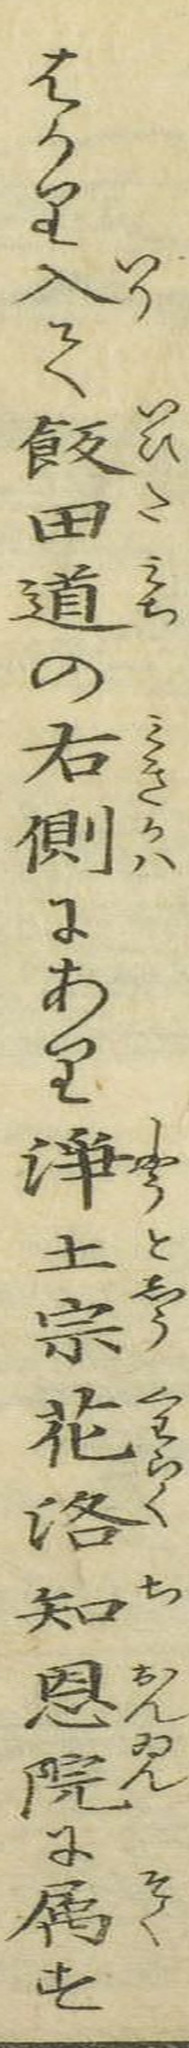はかり入て飯田道の右側にあり浄土宗花洛知恩院に属す
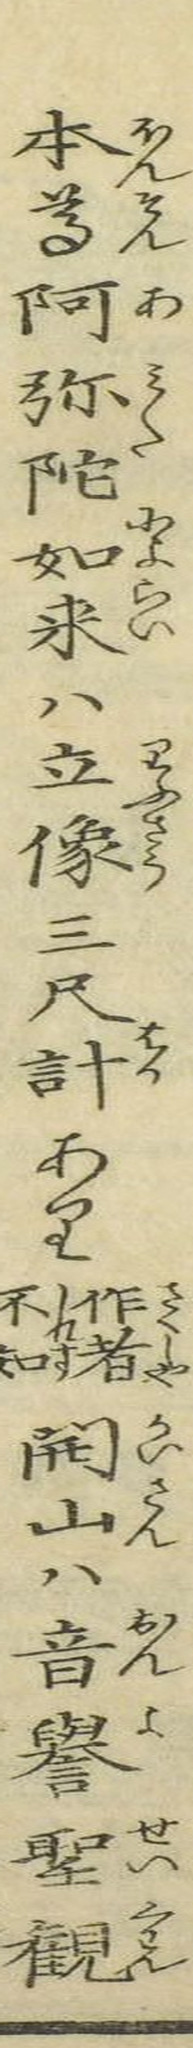本尊阿弥陀如来は立像三尺計あり作者不知開山は音譽聖観
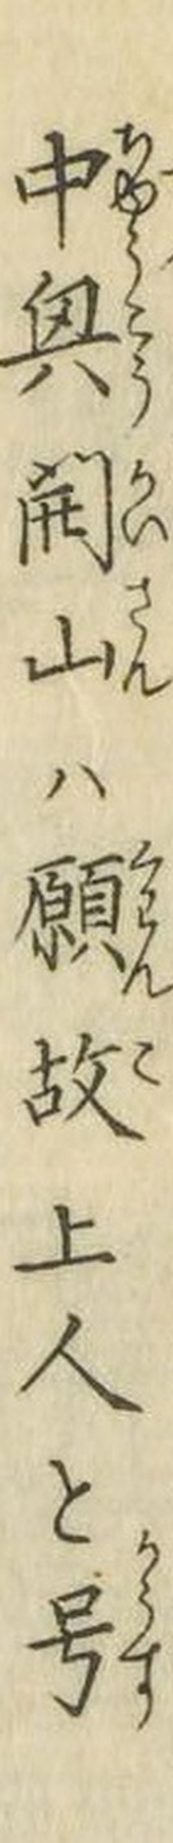中興開山は願故上人と号
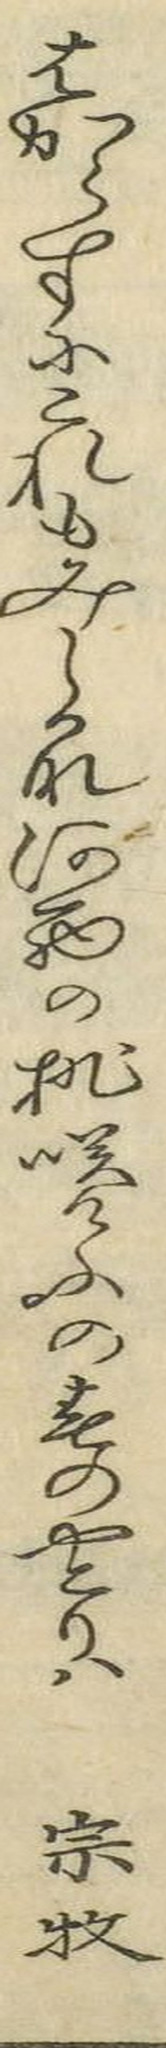はからすにこれもみしかな何物の桃咲けふの春のやとりは宗牧
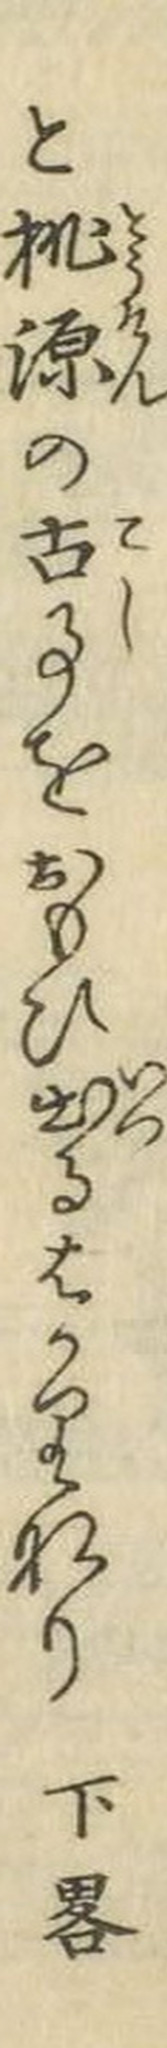と桃源の古事をおもひ出るはかりなり下略
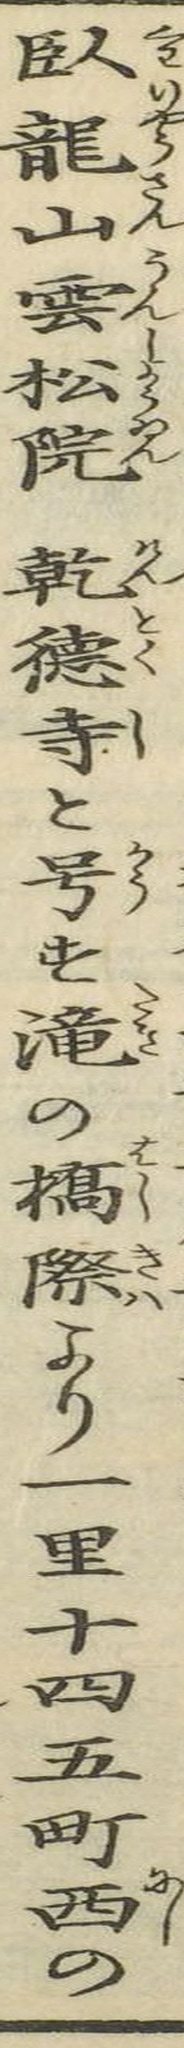臥龍山雲松院乾徳寺と号す滝の橋際より一里十四五町西の
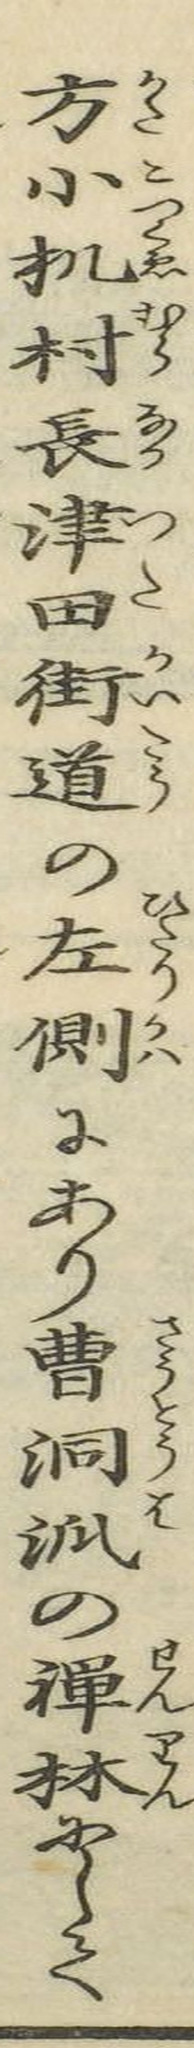方小机村長津田街道の左側にあり曹洞派の禅林にして
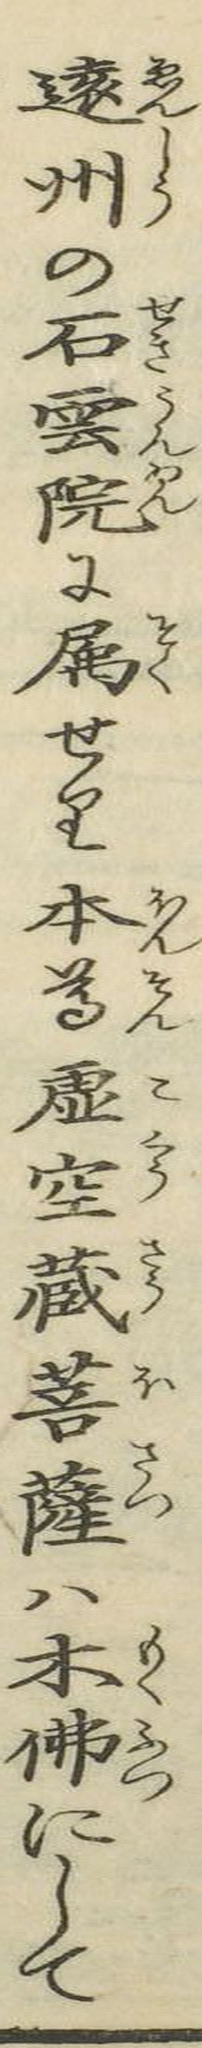遠州の石雲院に属せり本尊虚空蔵菩薩は木佛にして
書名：江戸名所図会 20巻 巻之5
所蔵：東京学芸大学教育コンテンツアーカイブ
